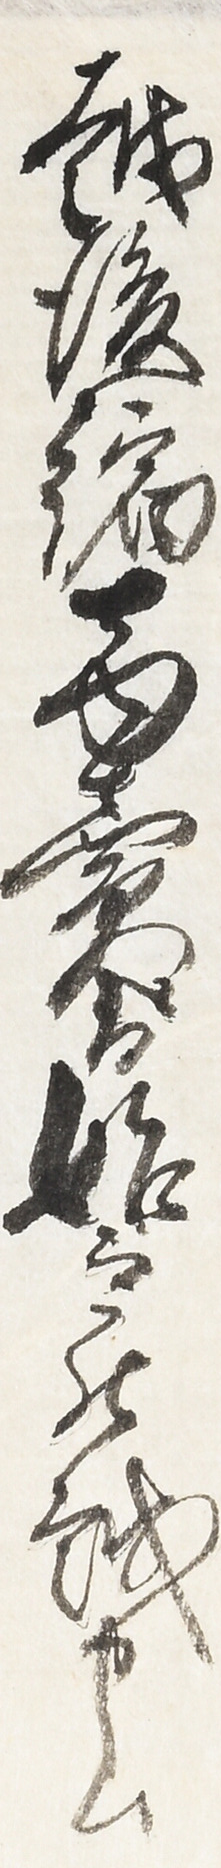越後縮商売ニ而始而罷越申候
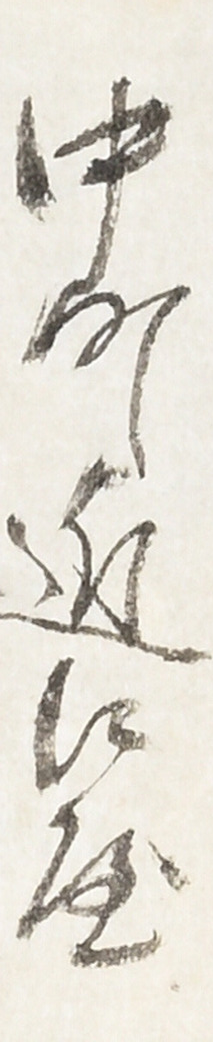中町近江屋
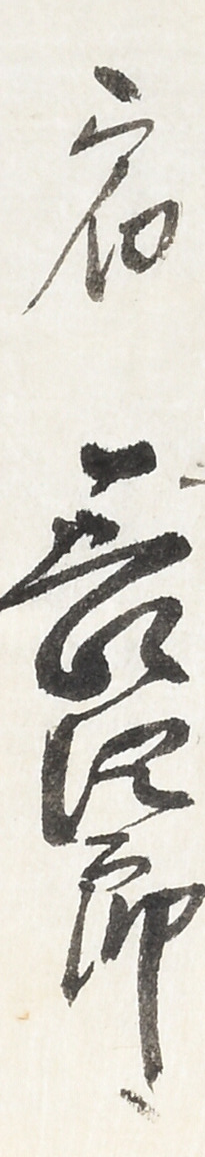宿善四郎
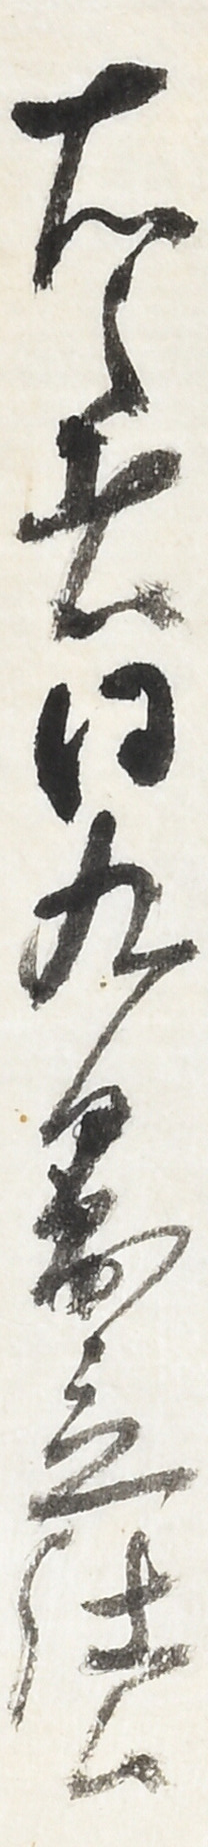右之者同九日出立仕候
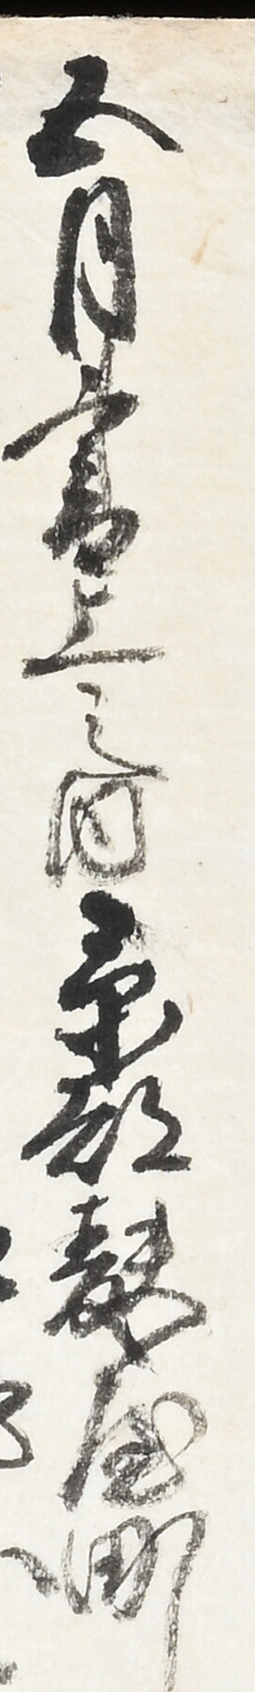五月書上之内京都麩屋町
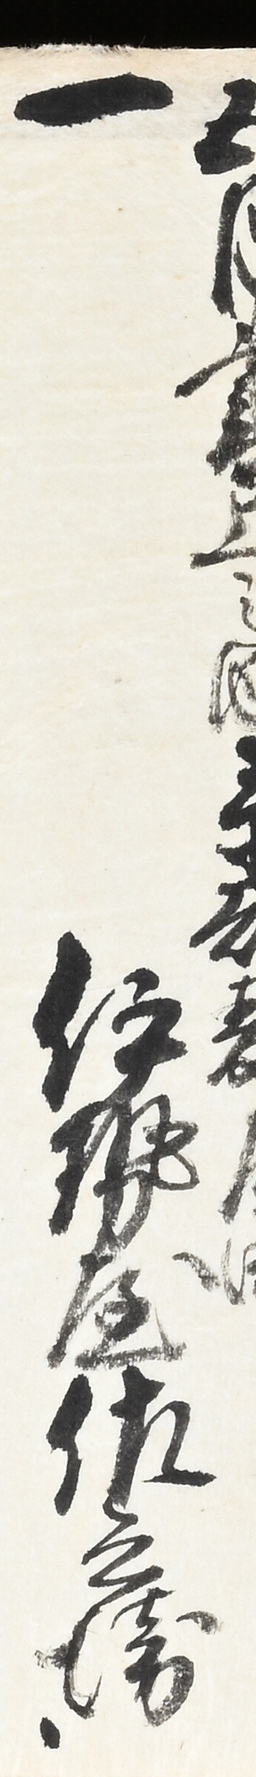一伊那屋佐兵衛・
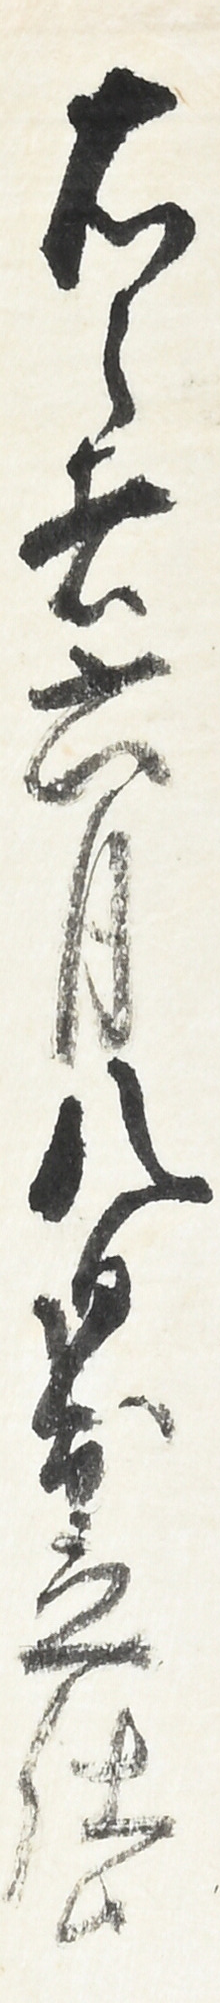右之者六月八日出立仕候
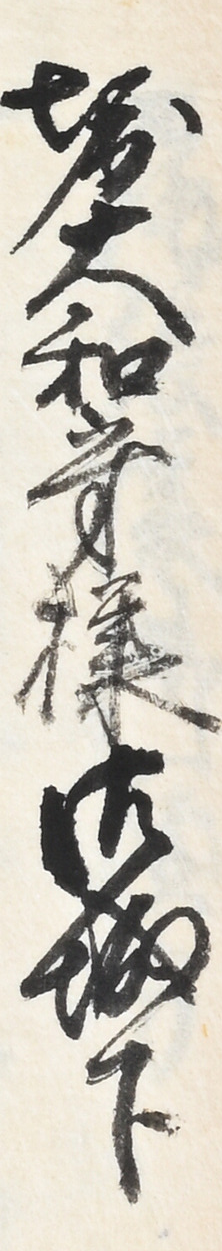堀大和守様御城下

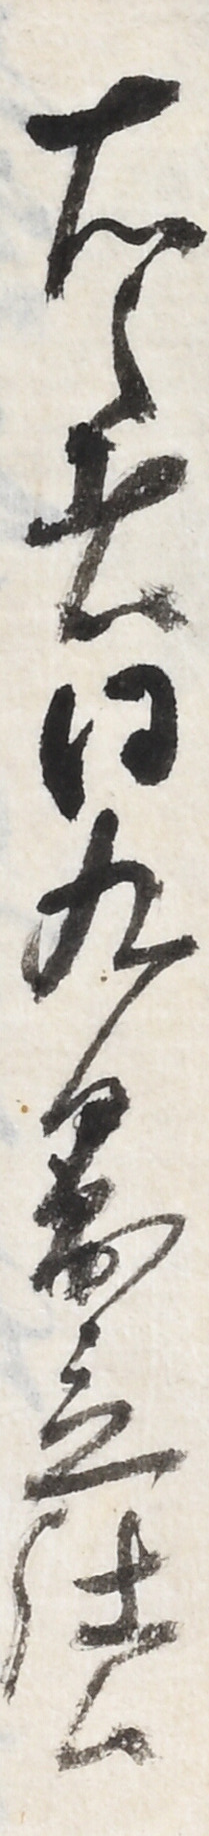右之者同十九日出立仕候
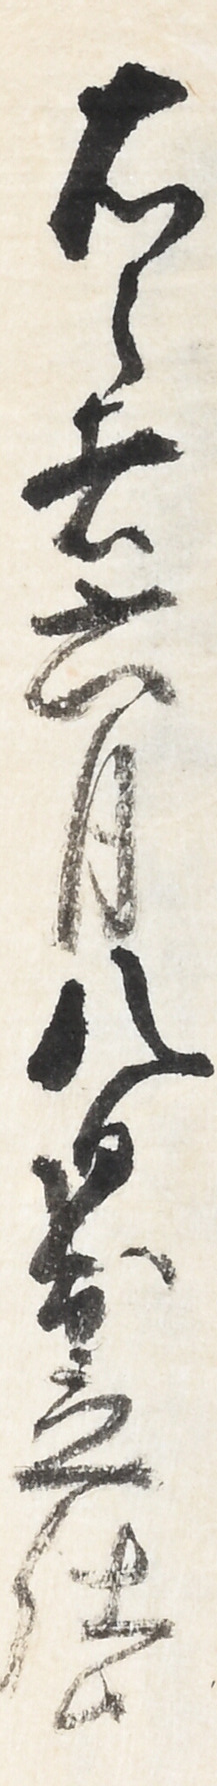右之者同十九日出立仕候
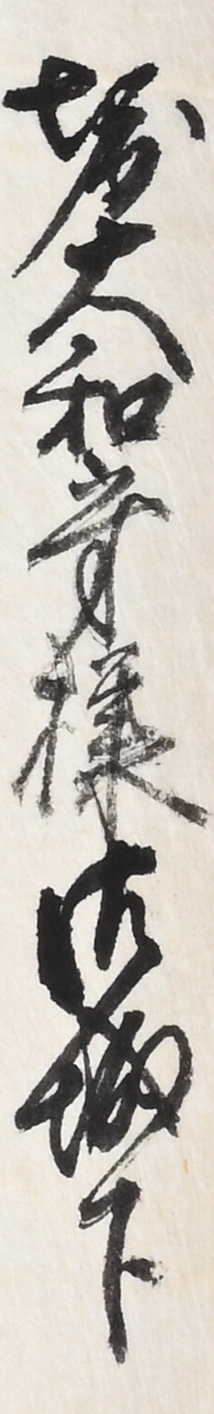堀大和守様御城下
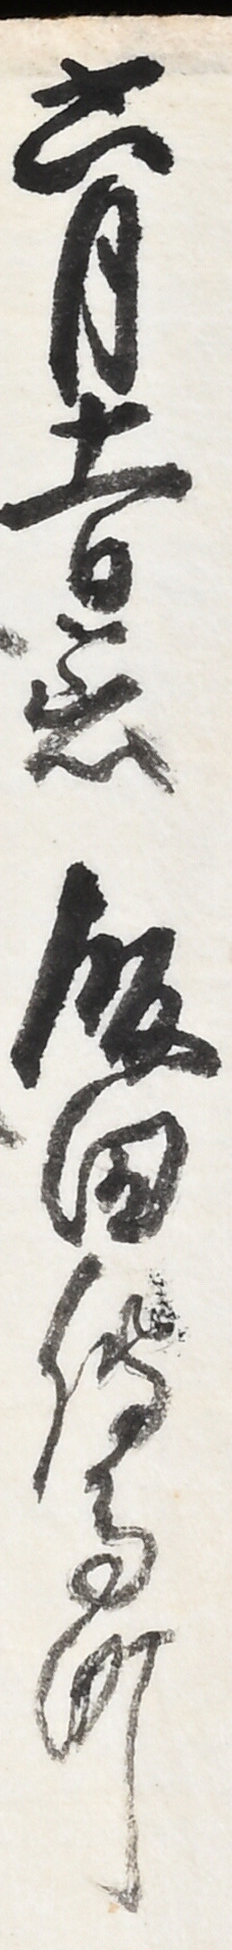六月十一日着飯田伝馬町
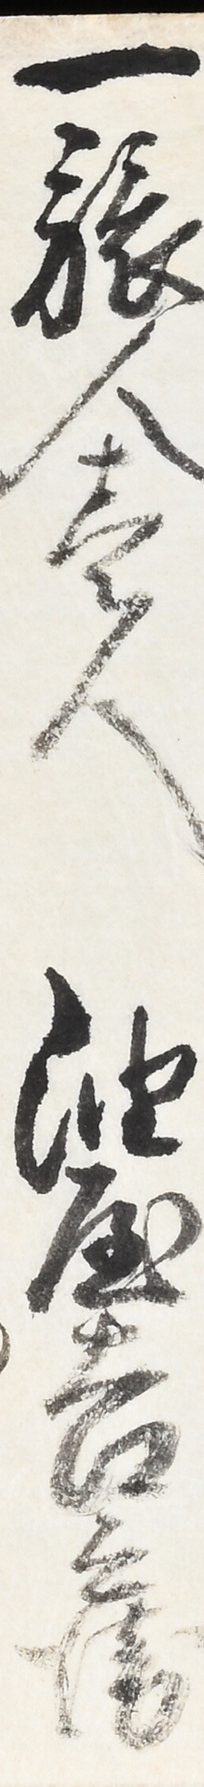一旅人壱人油屋吉兵衛
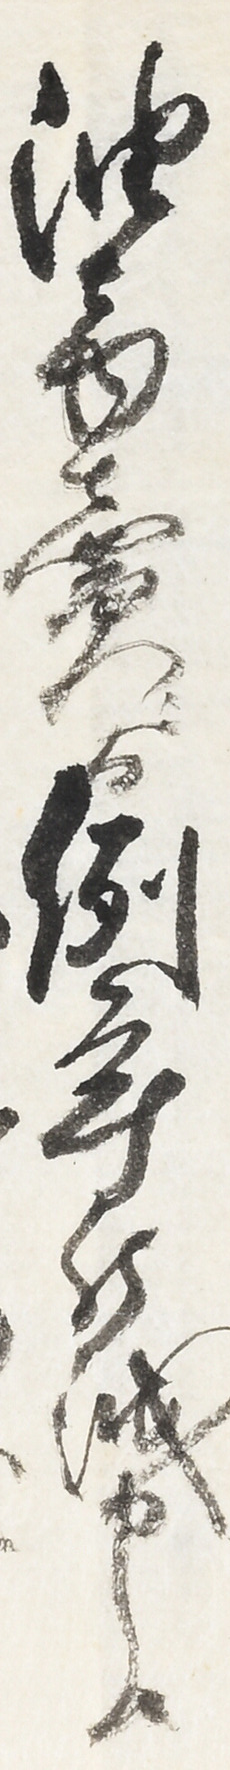油商売ニ而例年罷越申候
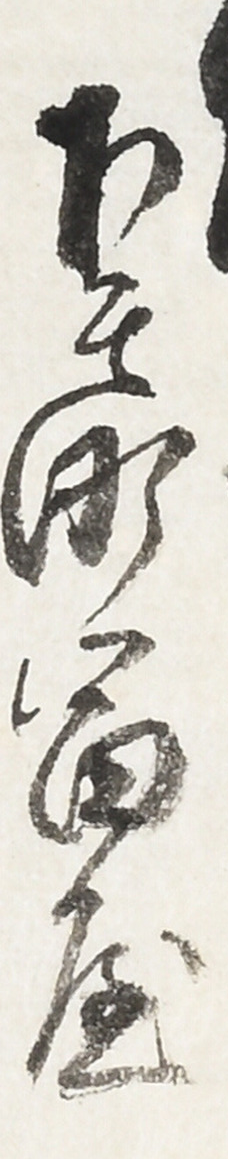下モ町冨屋
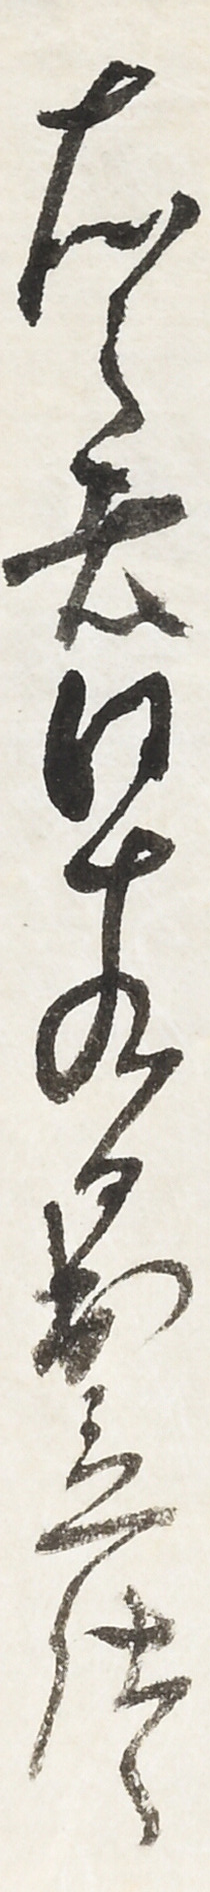右之者同十九日出立仕候
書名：旅人泊控帳
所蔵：伊那市立高遠町図書館・合同会社AMANE
